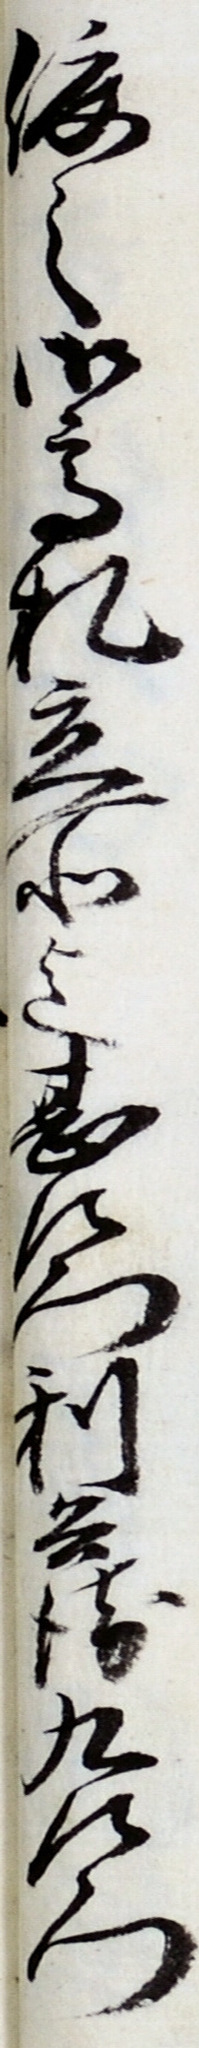依之御高札立所迄甚左衛門利兵衛九左衛門
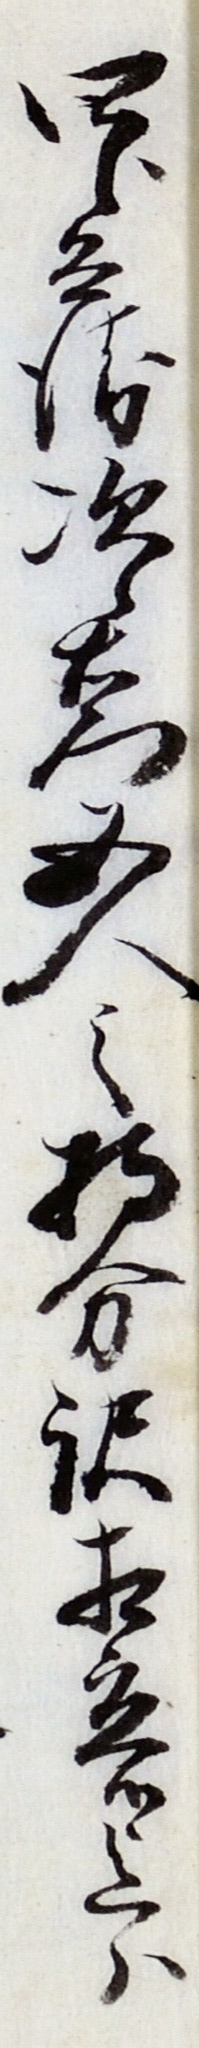四郎兵衛次郎右衛門五人之持分訳相立候迄ハ
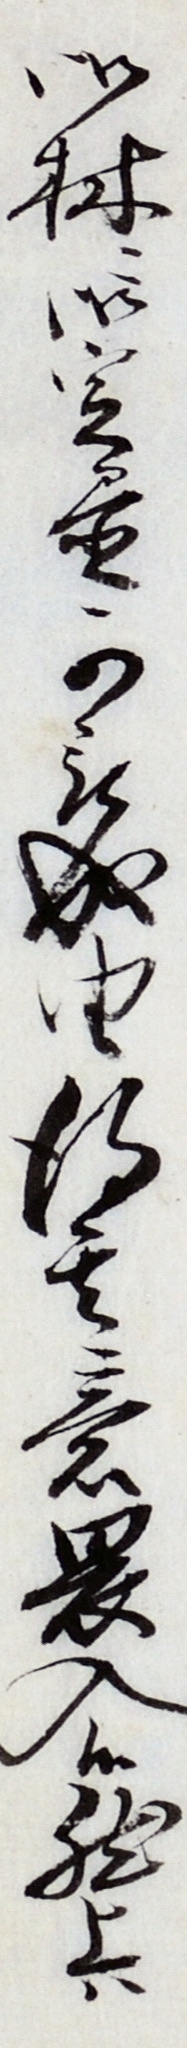御林ニ御定置可被成由得其意畏入候然上ハ
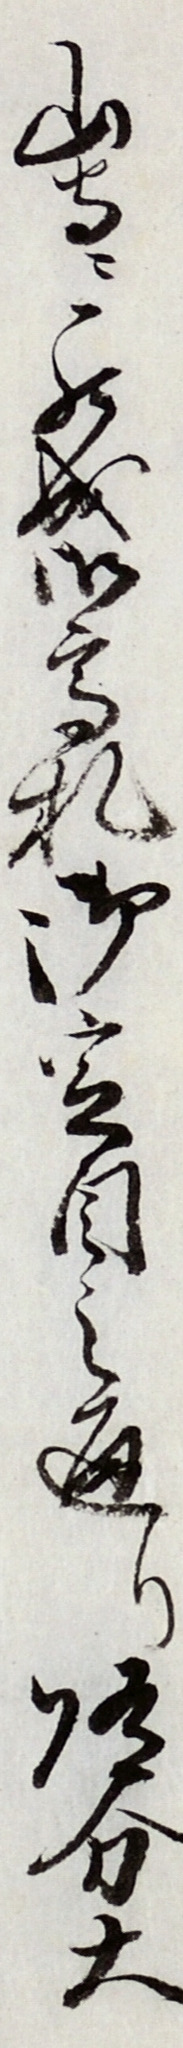山守ニ罷成御高札御定目之通り随分大
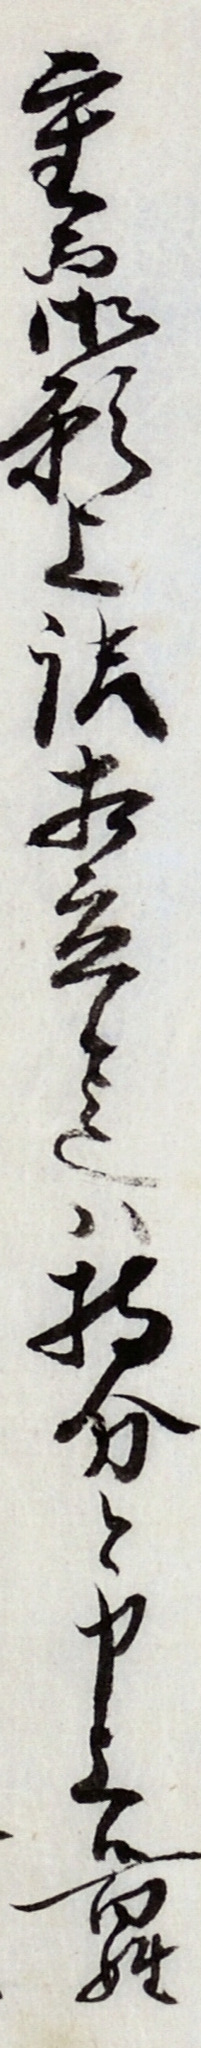重而御願上訳相立候迄ハ持分と申上候百姓
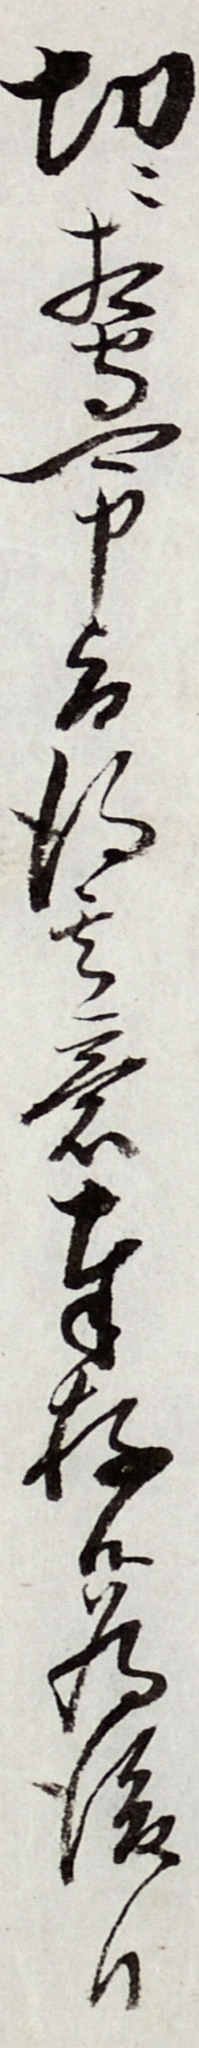切ニ相守可申旨得其意奉存候為後日
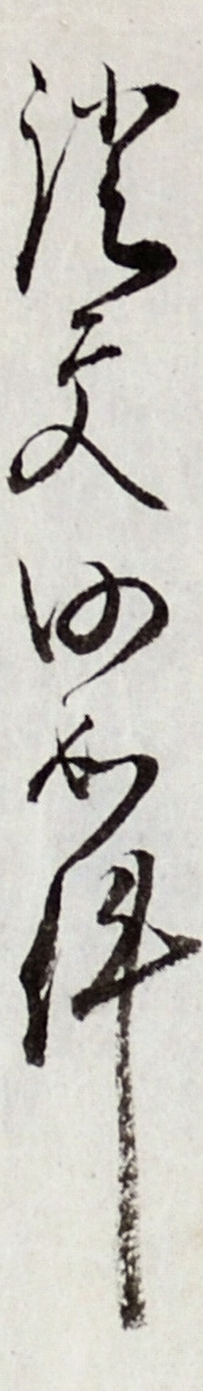証文仍如件
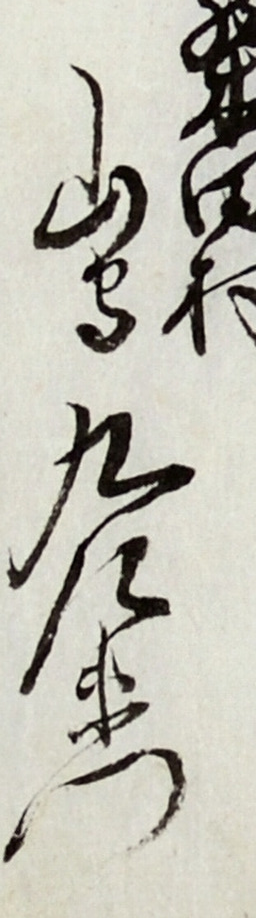山守九左衛門

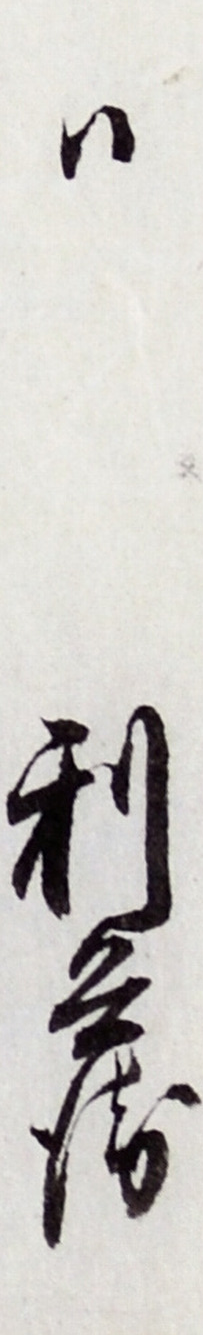同利兵衛
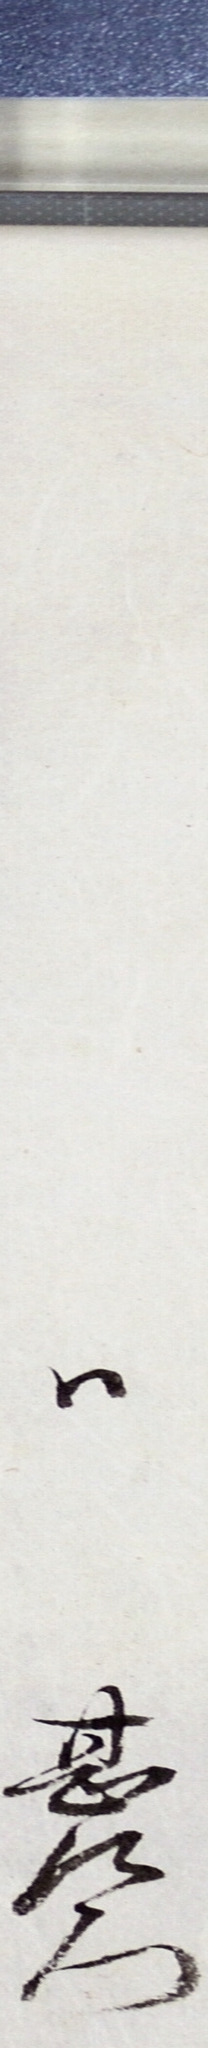同甚左衛門
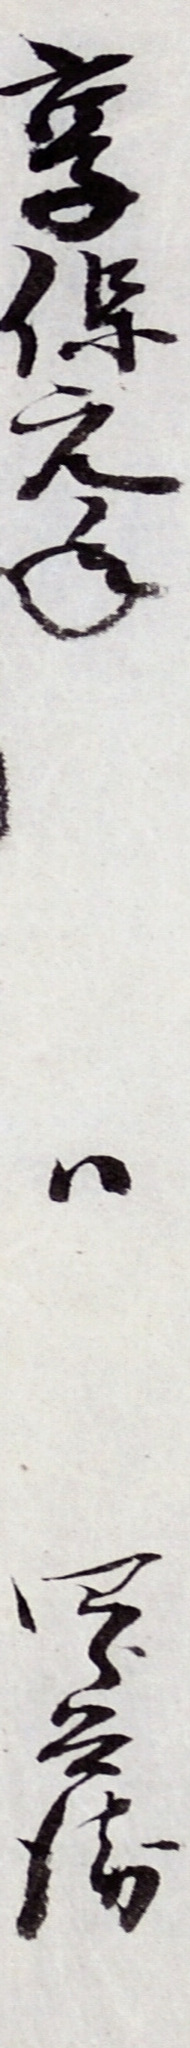享保元年同四郎兵衛
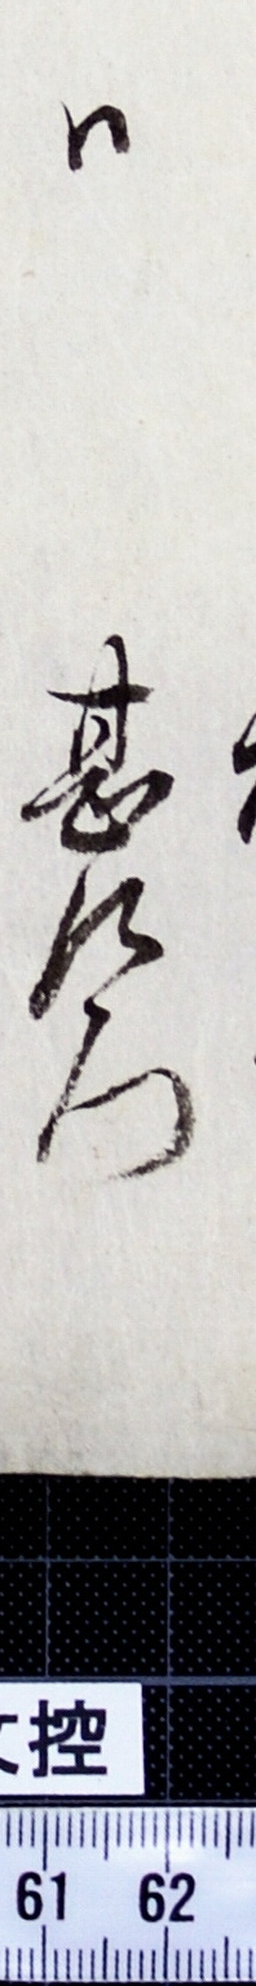同甚左衛門
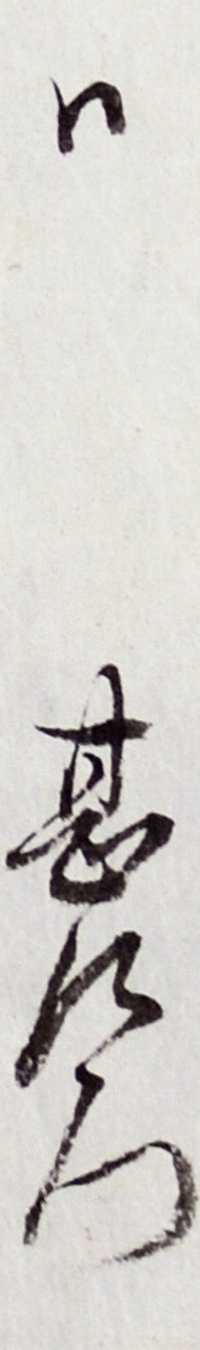同甚左衛門
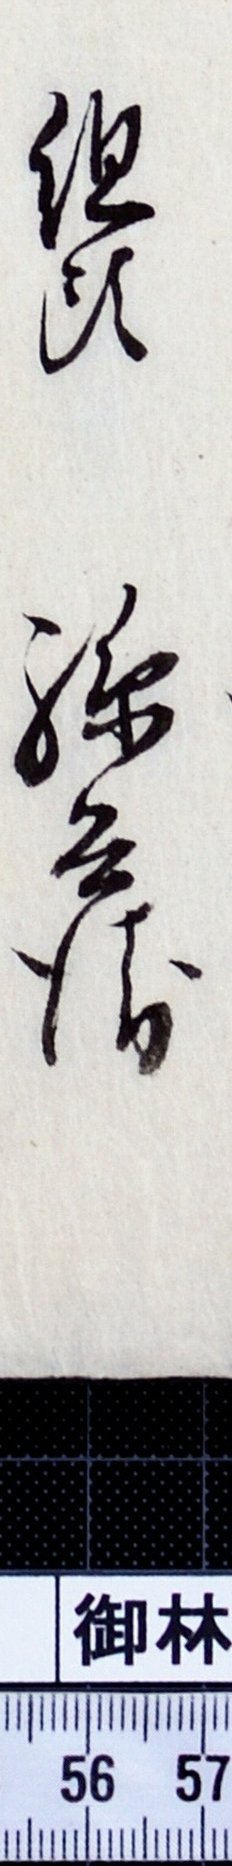組頭孫兵衛
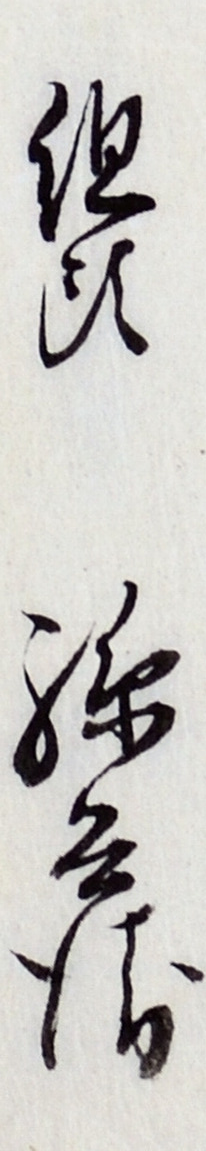組頭孫兵衛
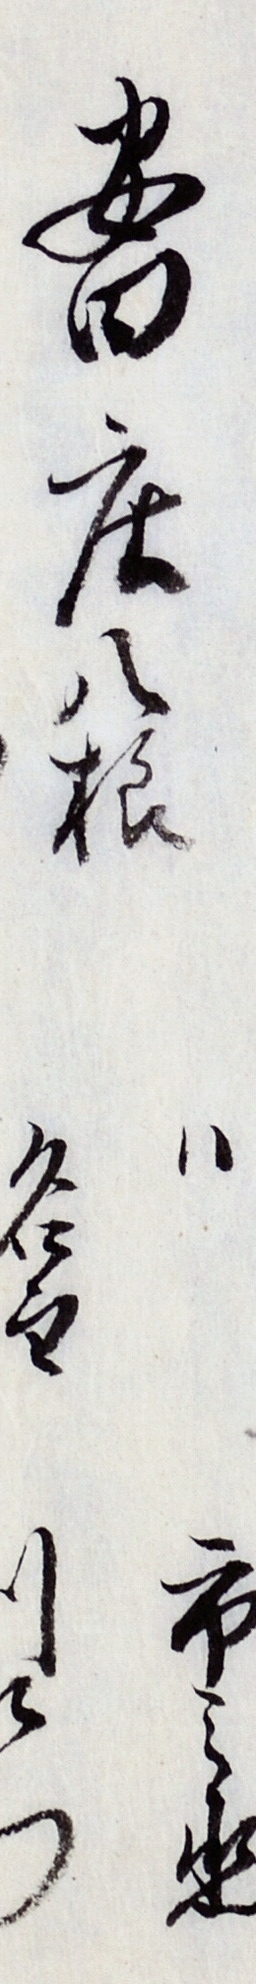安田庄八様名主利左衛門
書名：御林御竹藪証文控
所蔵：伊那市立高遠町図書館・合同会社AMANE
